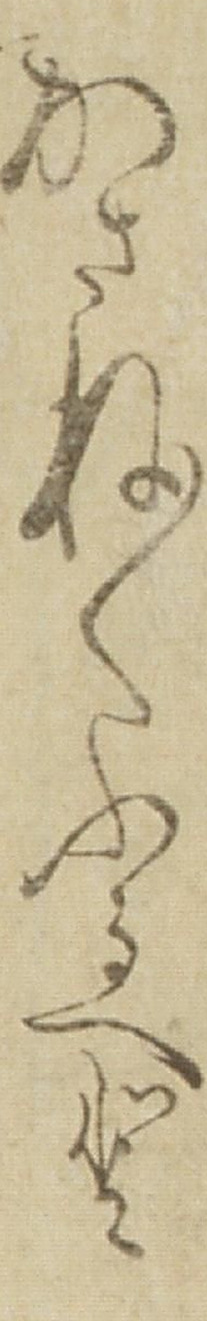かさね〳〵ふるへと
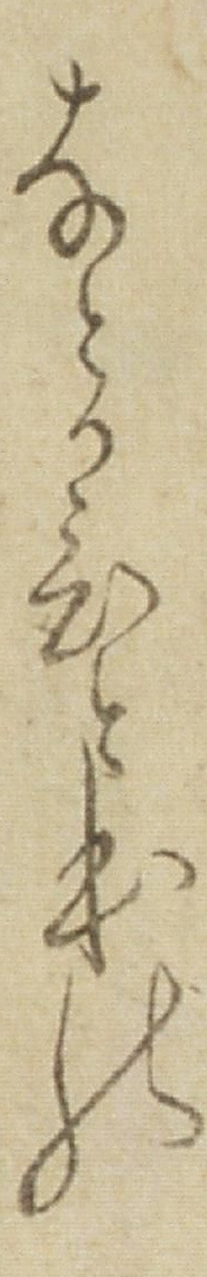なとかひと本の
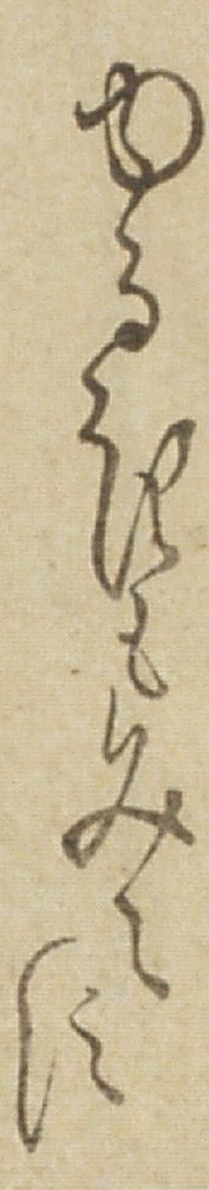ゆるきもみえす
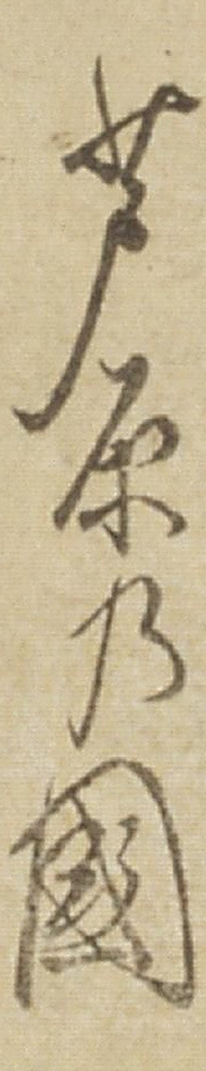芦原の国
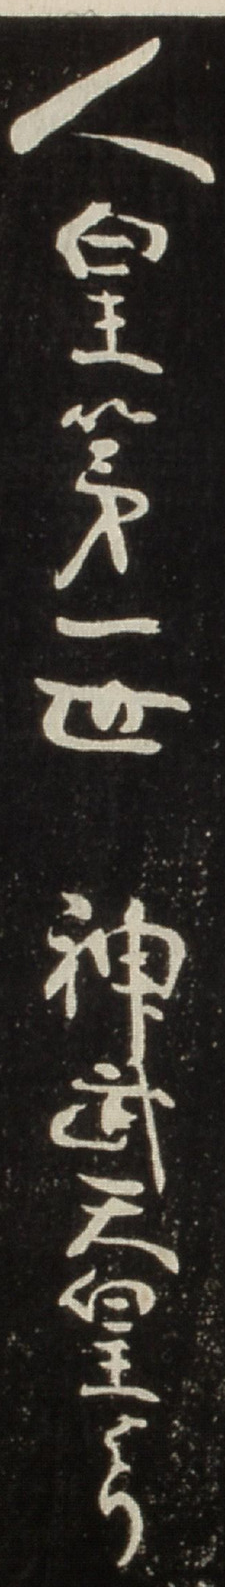人皇第一世神武天皇より
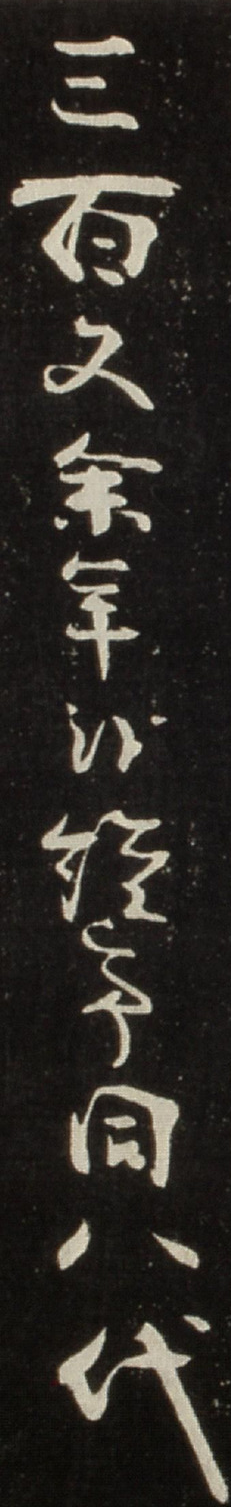三百又余年を経て同八代
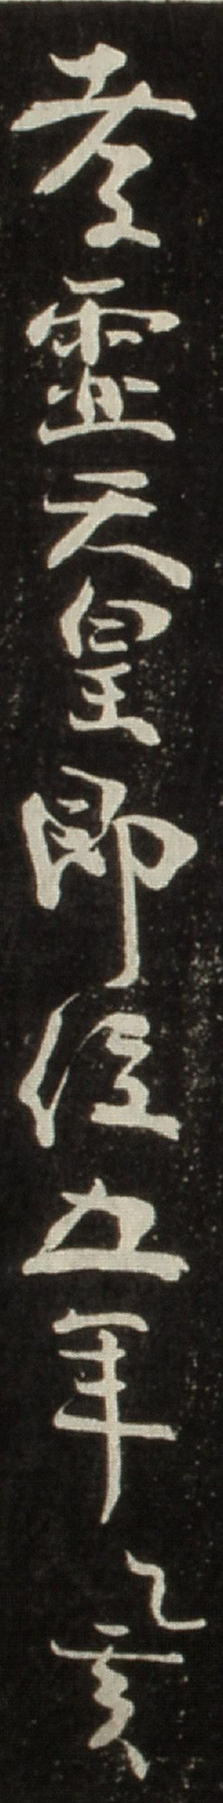孝霊天皇即位五年乙亥
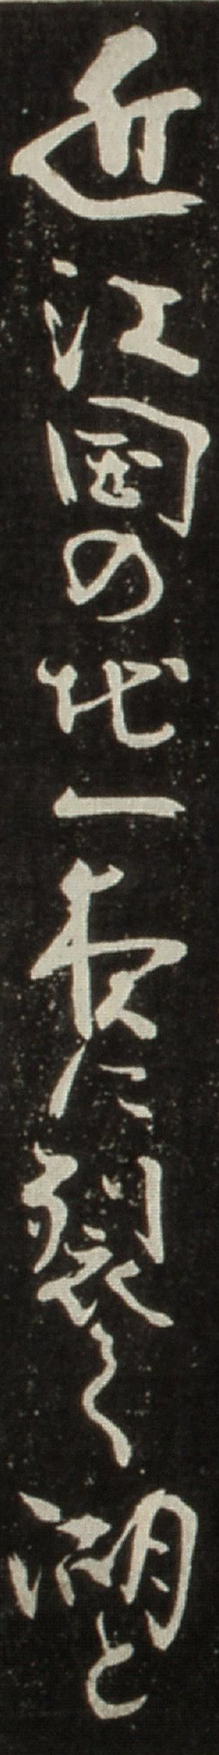近江国の地一夜に裂て湖と

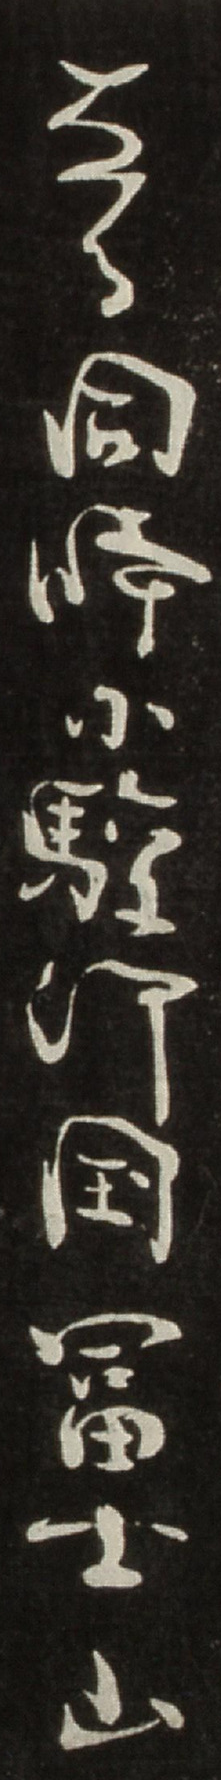なる同時に駿河国冨士山
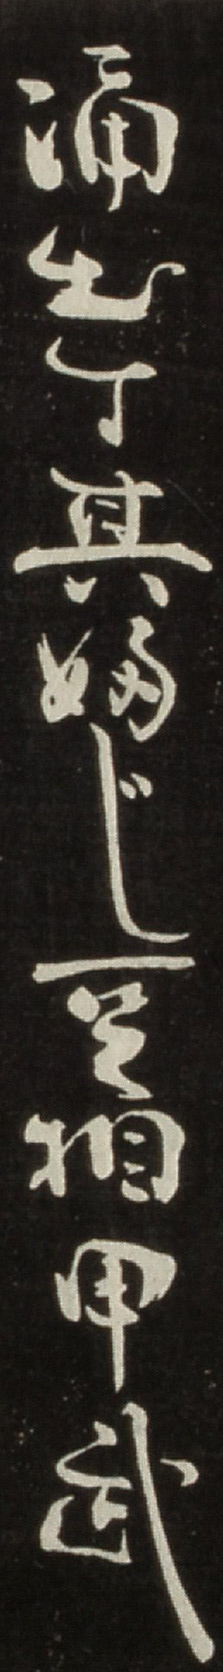湧出す其ふじ豆相甲武
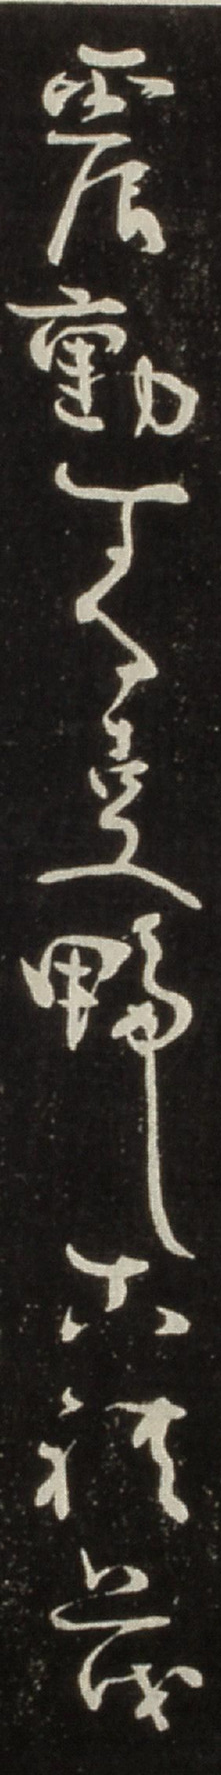震動する事夥しこれも
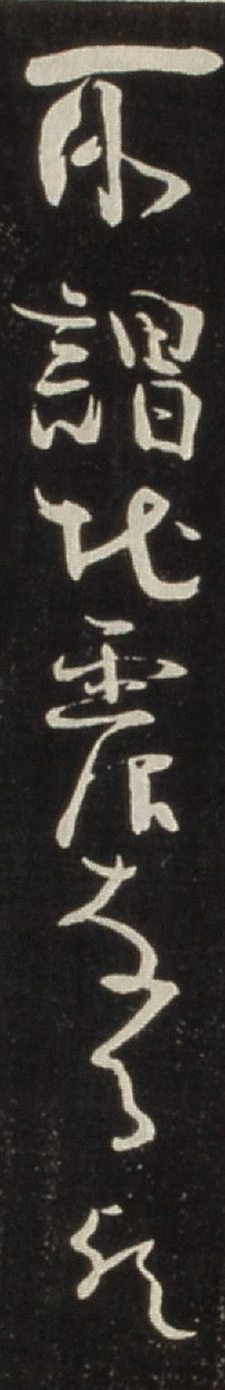所謂地震なる歟
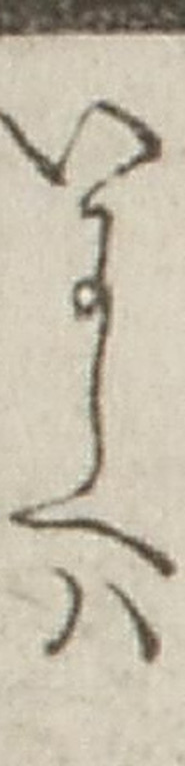いにしへハ
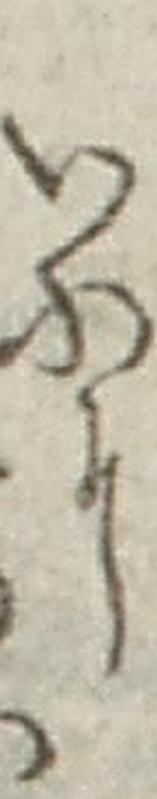いふに
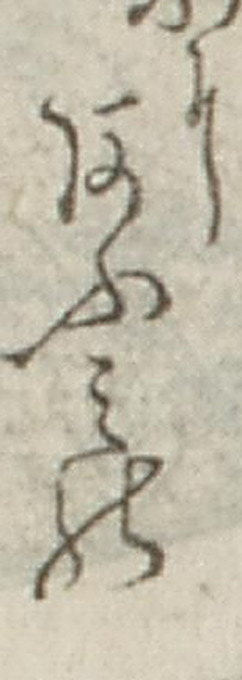あふミの
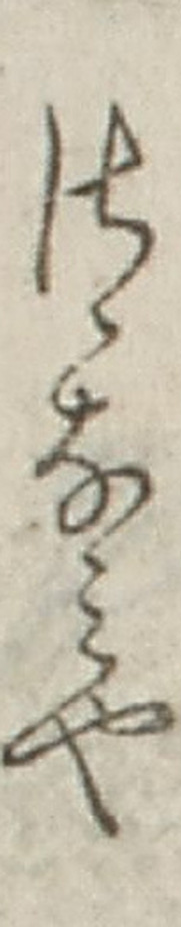つゝなミや
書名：世直り艸紙
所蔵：東京大学地震研究所図書室 Earthquake Research Institute Library, The University of Tokyo, JAPAN
